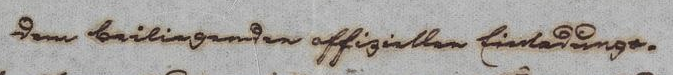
Dem beiliegenden offiziellen Einladungs-
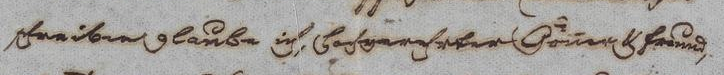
schreiben glaube ich, hochverehrter Gönner & Freund,
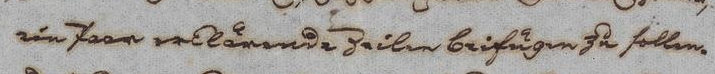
ein Paar erklärende Zeilen beifügen zu sollen.
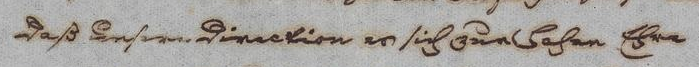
Daß unsere Direction es sich zur hohen Ehre
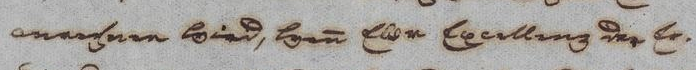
anrechnen wird, wenn Euer Excellenz der Er-
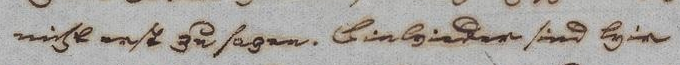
nicht erst zu sagen. Hinwieder sind wir
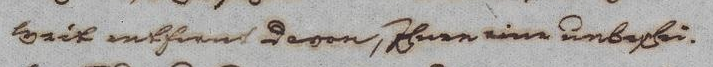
weit entfernt davon, Ihnen eine unbeschei-
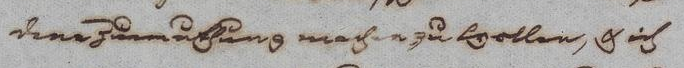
dene Zumuthung machen zu wollen, & ich
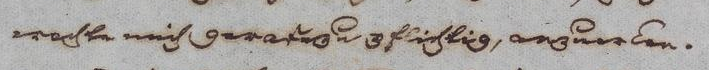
erachte mich geradezu pflichtig, anzuerken-
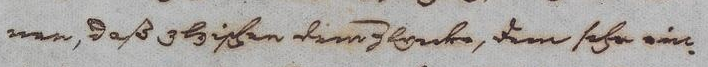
nen, daß zwischen dem Zwecke, dem sehr ein-
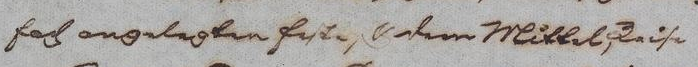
fach angelegten Feste, & dem Mittel, Reise
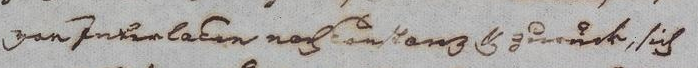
von Interlaken nach Constanz & zurück, sich
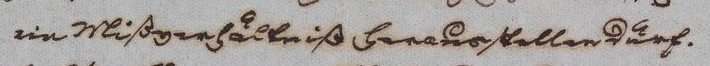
ein Mißverhältniß herausstellen dürf-
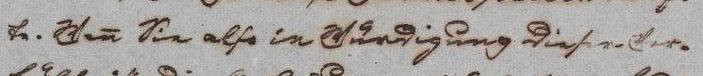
te. Wenn Sie also in Würdigung dieser Ver-
